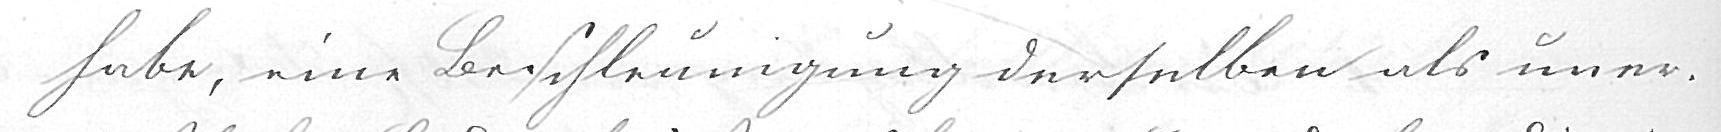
habe, eine Beschleunigung derselben als uner-
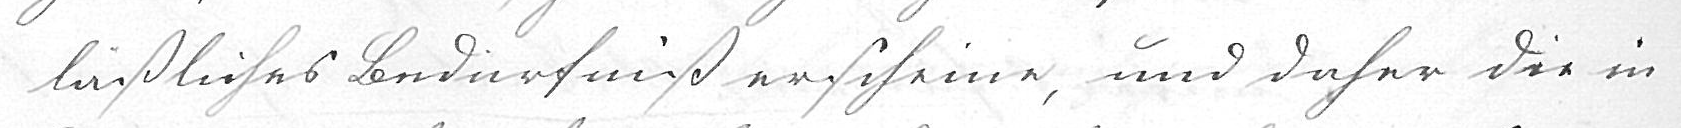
läßliches Bedürfniß erschiene, und daher die in
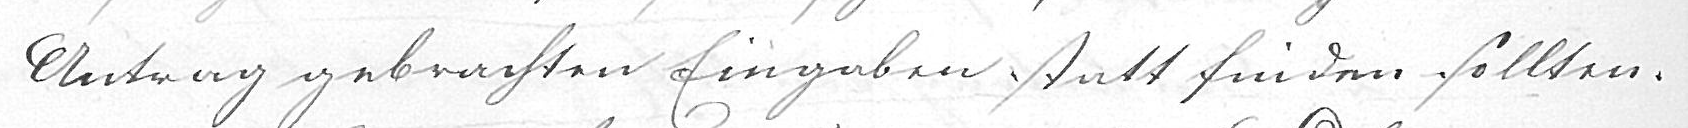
Antag gebrachten Eingaben stattfinden sollten.
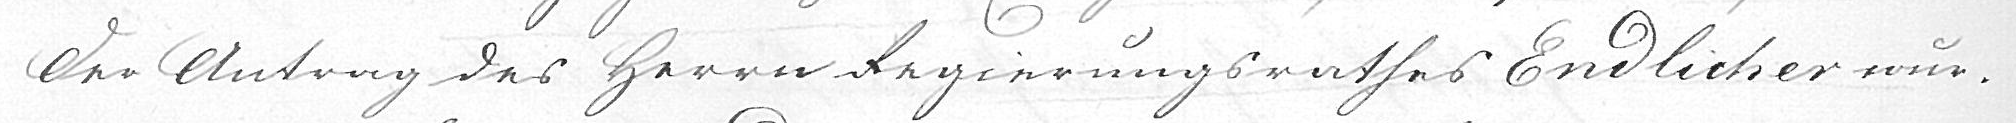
Der Antrag des Herrn Regierungsrathes Endlicher wur-
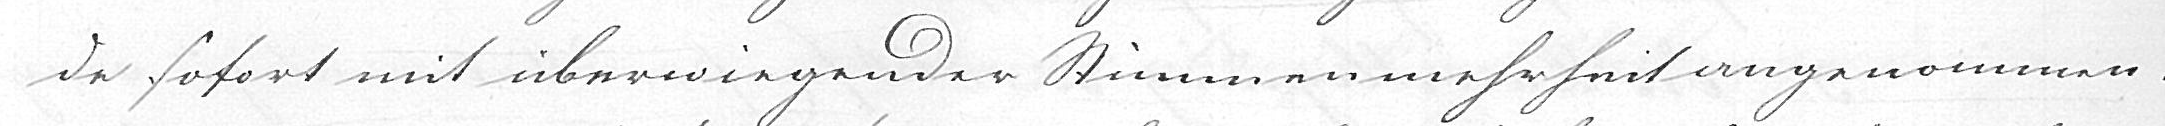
de sofort mit überwiegender Stimmenmehrheit angenommen.
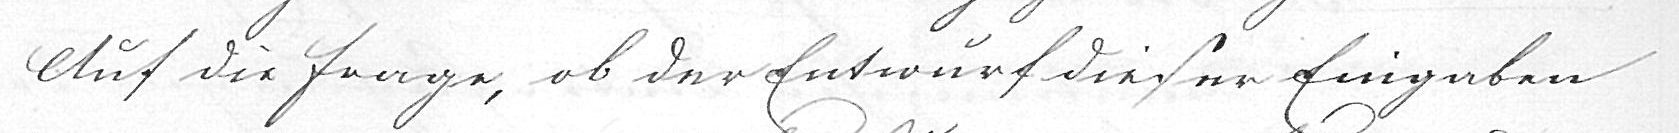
Auf die Frage, ob der Wntwurf dieser Eingaben
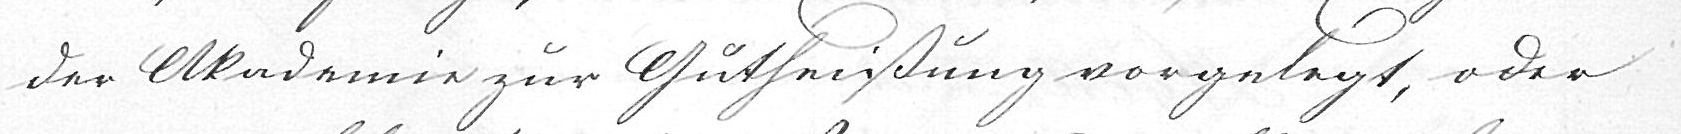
der Akademie zur Gutheißung vorgelegt, oder
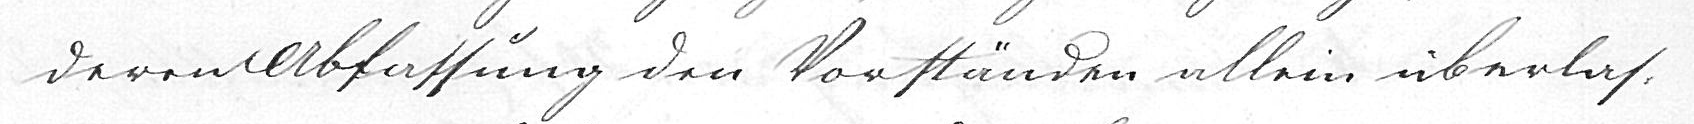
deren Abfassung den Vorständen allein überlas-
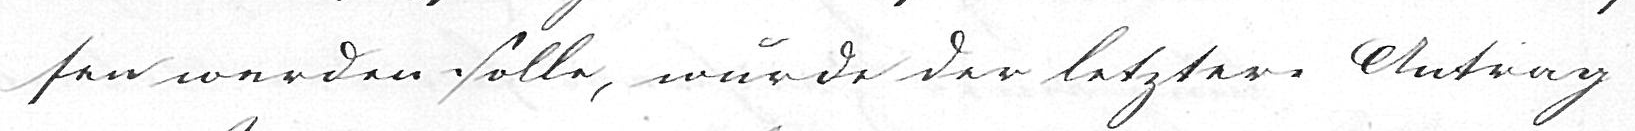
sen werden solle, wurde der letztere Antrag
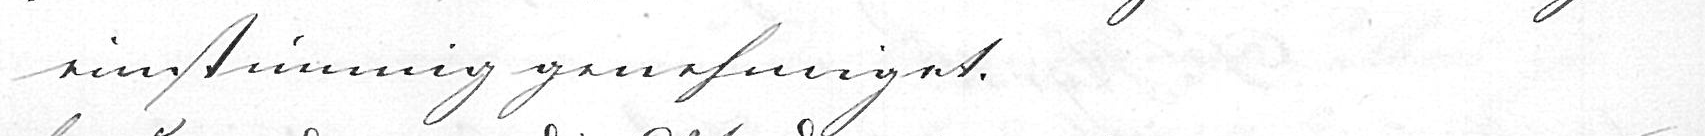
eingstimmig genehmiget.
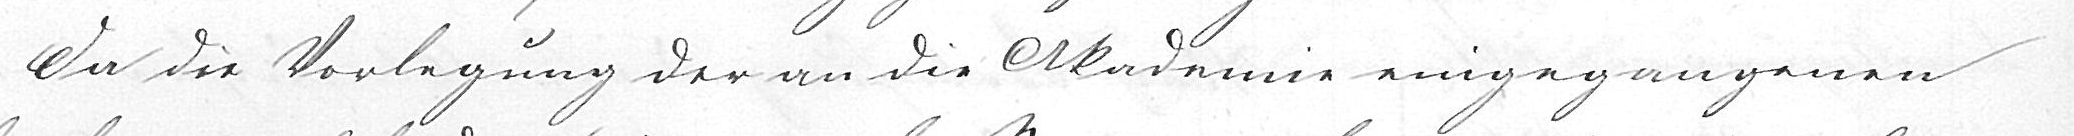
Da die Vorlegung der an die Akademie eingegangenen
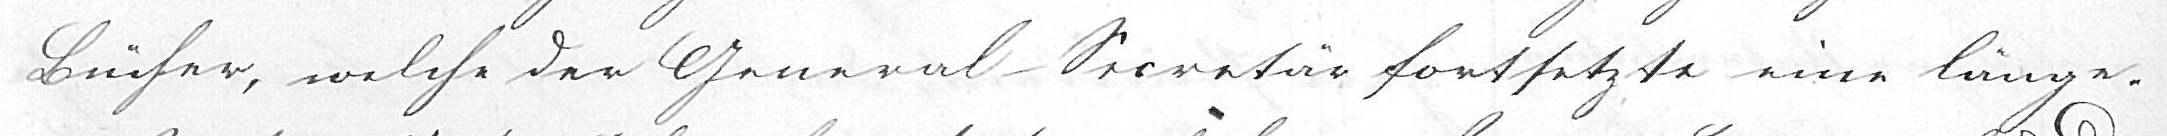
Bücher, welche der General-Secretär fortsetzte, eine länge-
